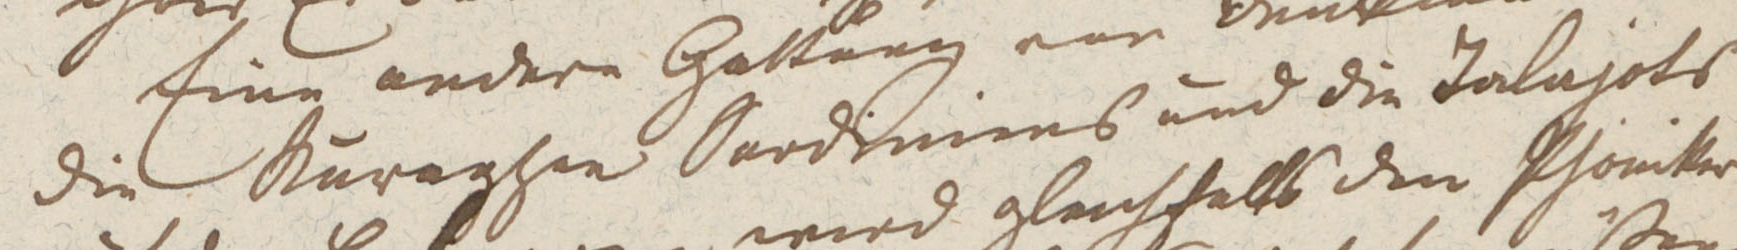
die Nuraghen Sardiniens und die Talajots
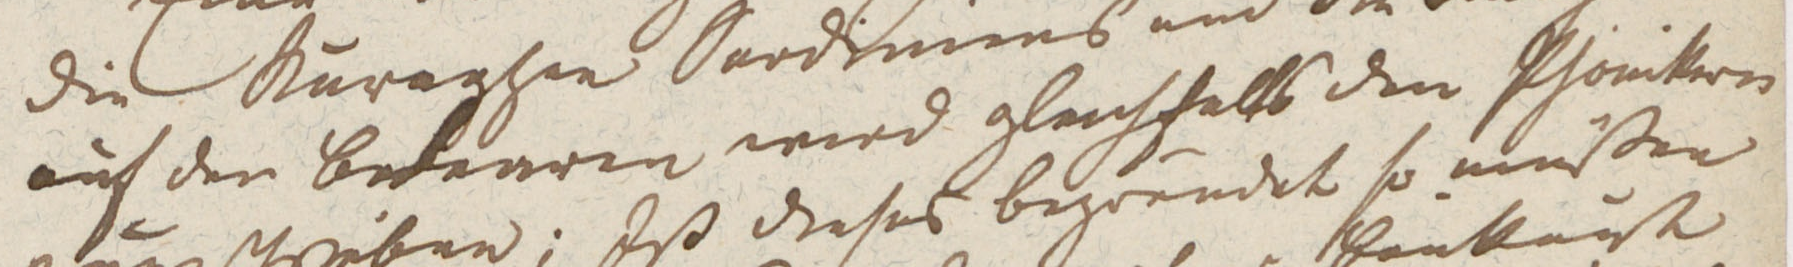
auf den Balearen wird gleichfalls den Phönikern
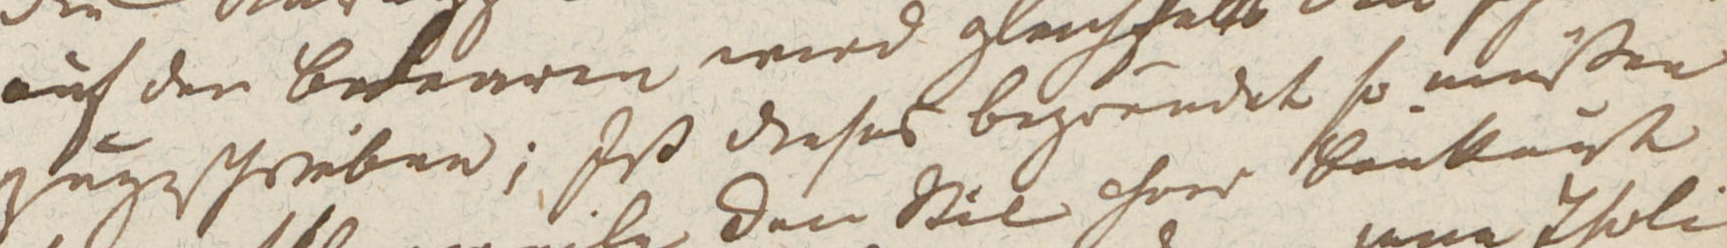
zugeschrieben; Ist dieses begründet so müssen
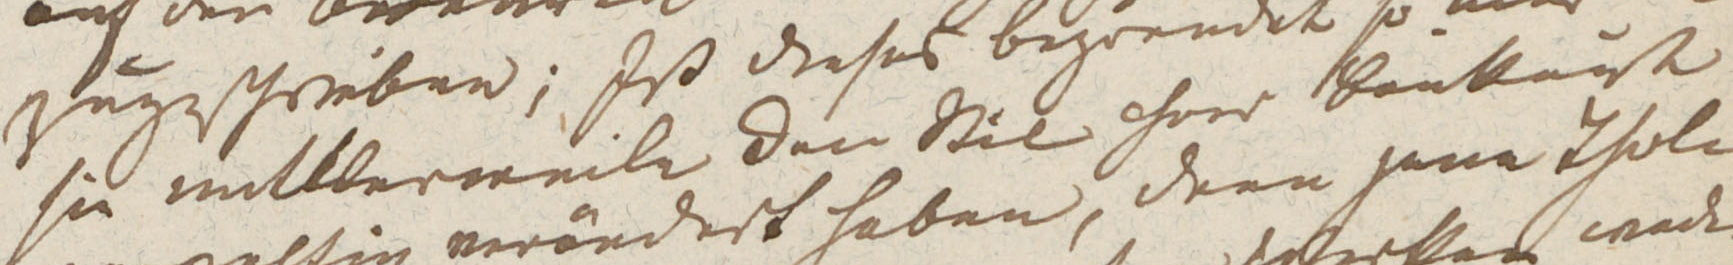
sie mittlerweile den Stil ihrer Baukunst
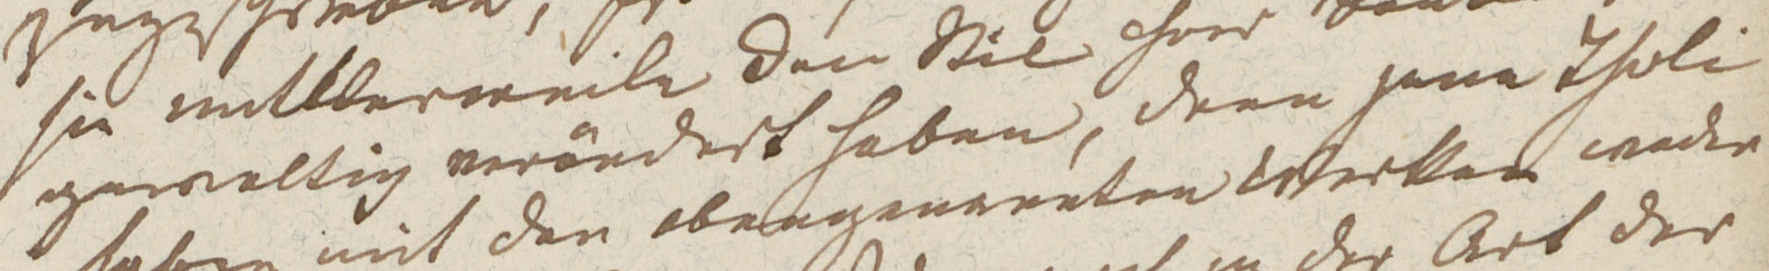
gewaltig verändert haben, denn jene Tholi
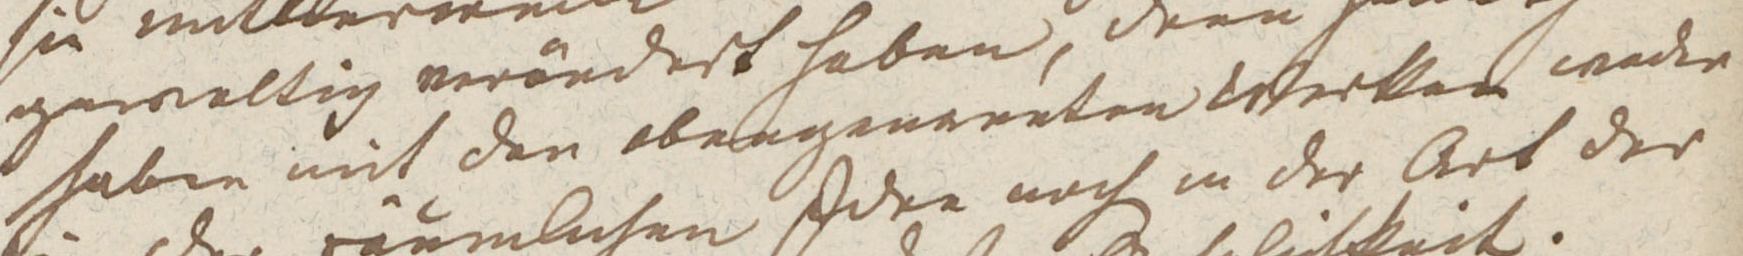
haben mit den obengenannten Werken weder
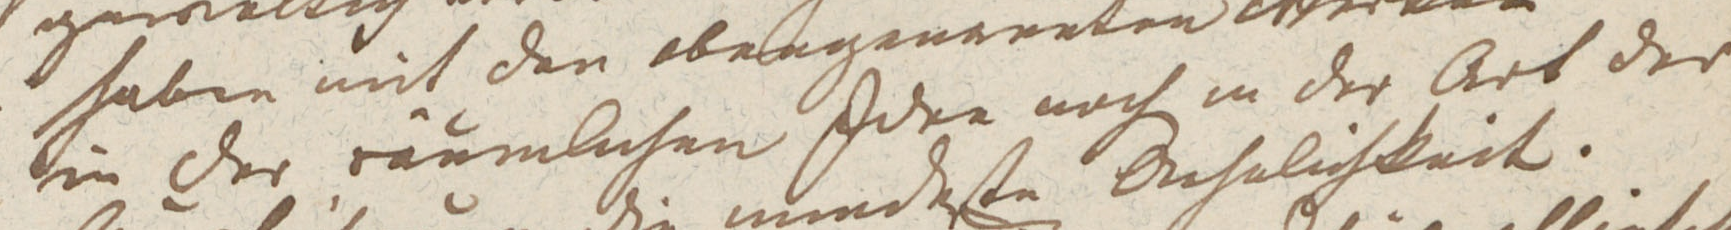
in der räumlichen Idee noch in der Art der
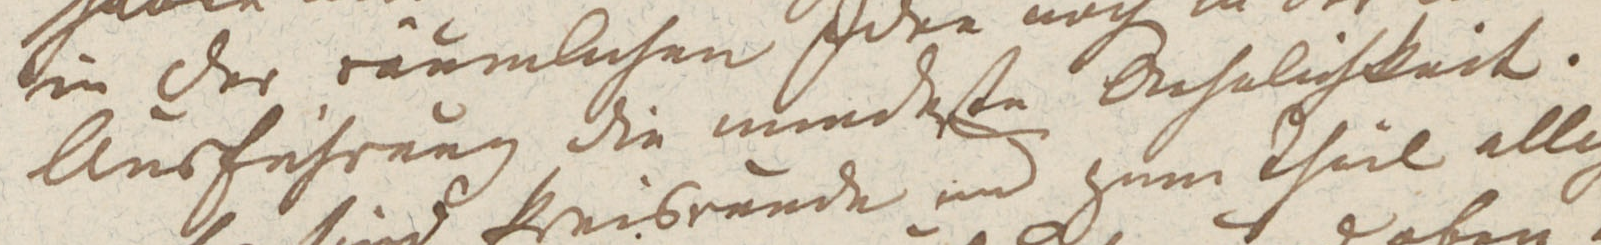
Ausführung die mindeste Aehnlichkeit.
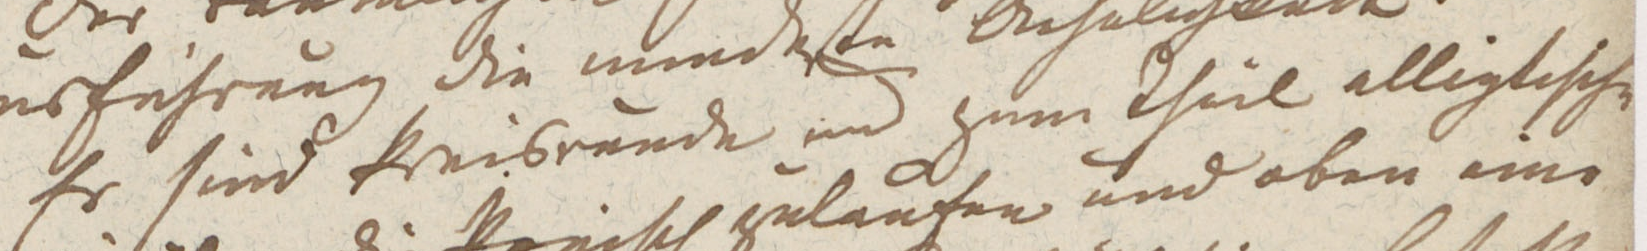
Es sind kreisrunde und zum Theil elliptische
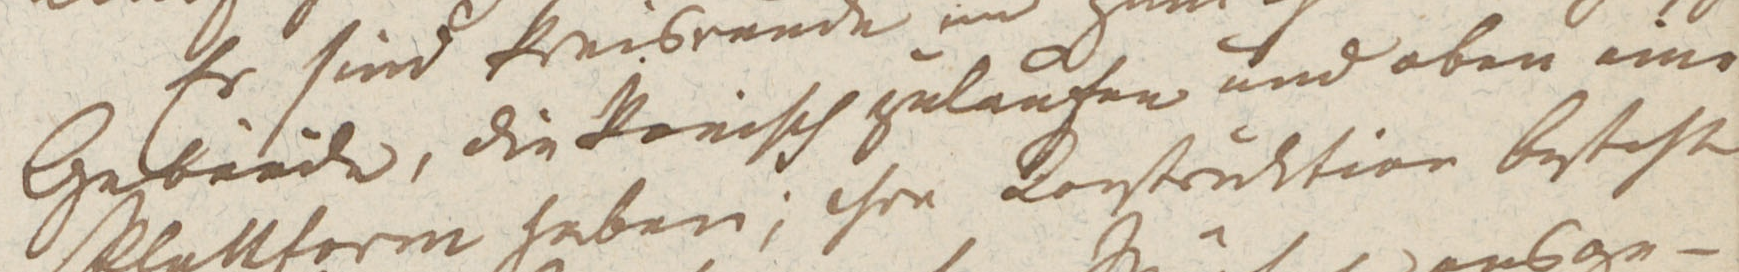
Gebäude, die konisch zulaufen und oben eine
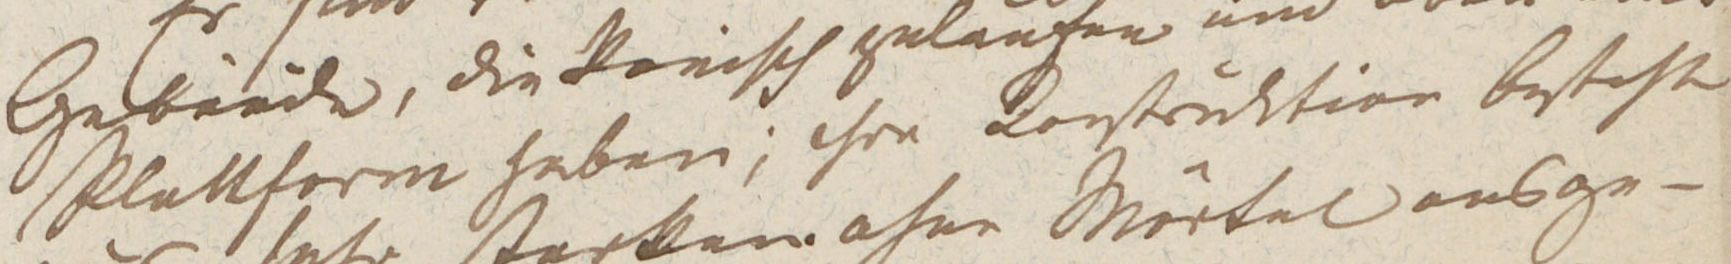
Plattform haben; ihre Konstruktion besteht
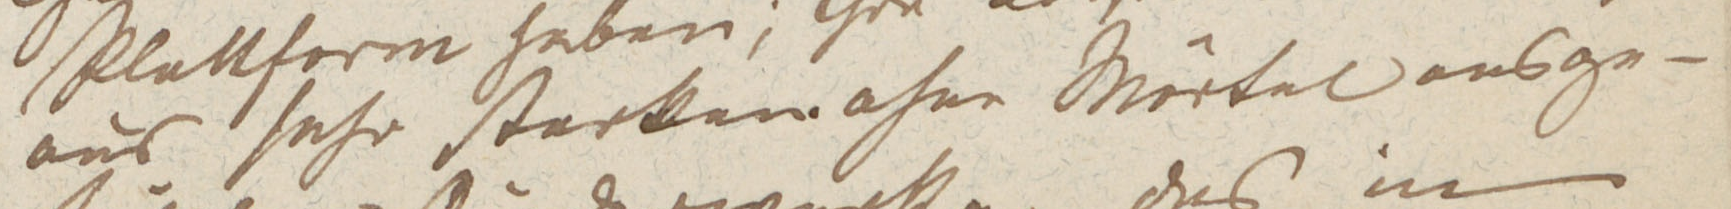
aus sehr starken ohne Mörtel ausge-
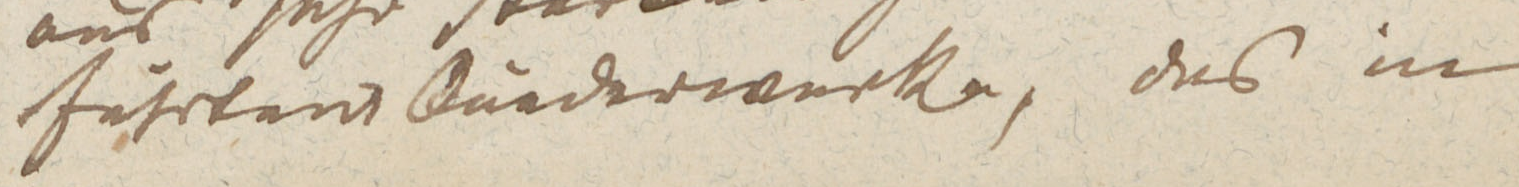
führtenm Quaderwerke, das in
